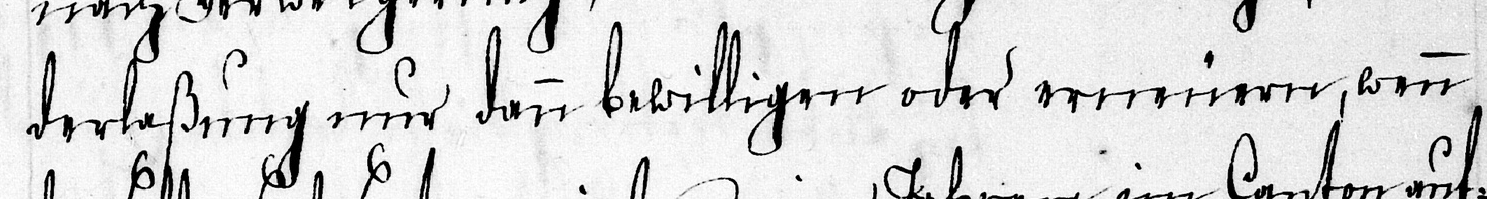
derlaßung nur dann bewilligen oder erneuern, wenn
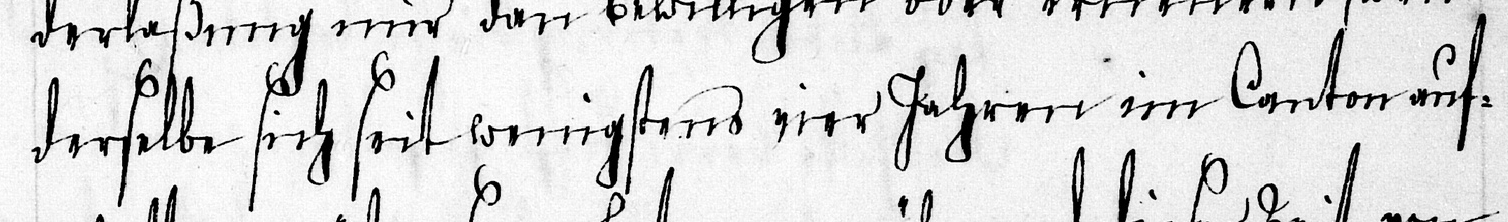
derselbe sich seit wenigstens vier Jahren im Canton auf¬
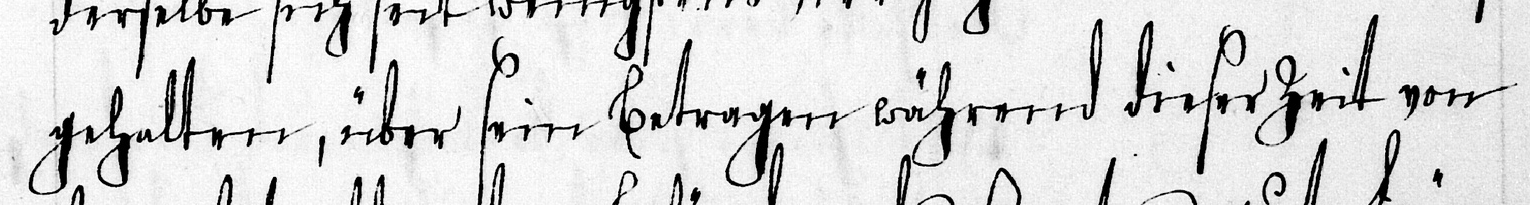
gehalten, über sein Betragen während dieser Zeit von
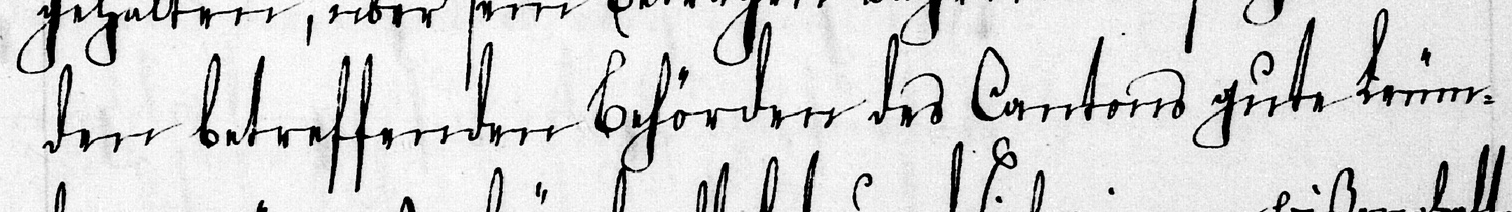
den betreffenden Behörden des Cantons gute Leum¬
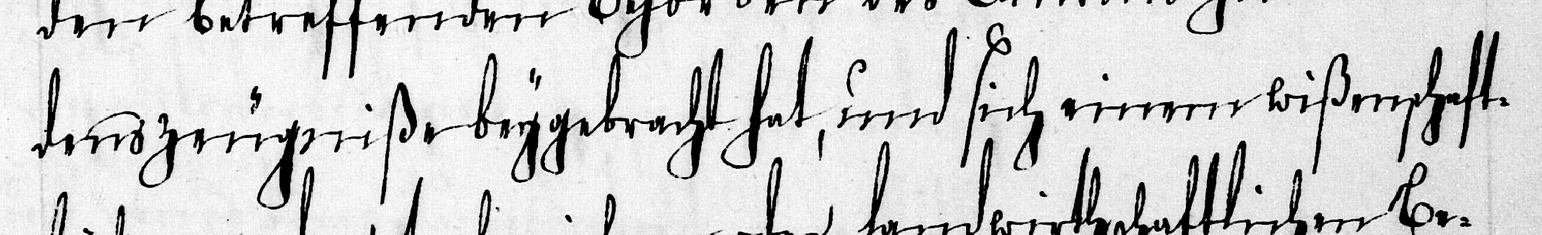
denszeugniße beygebracht hat, und sich einem wißenschaft¬
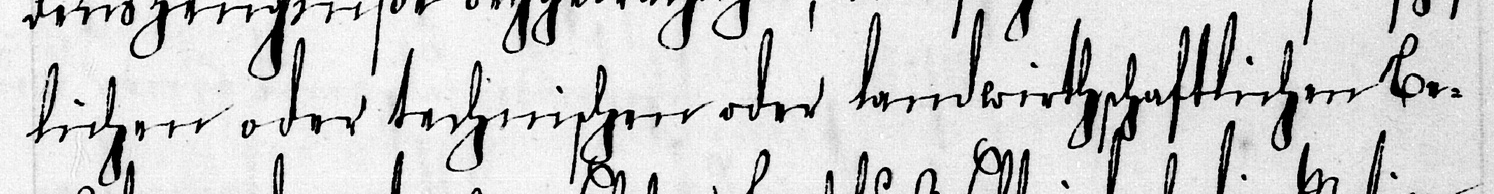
lichen oder technischen oder landwirthschaftlichen Be¬
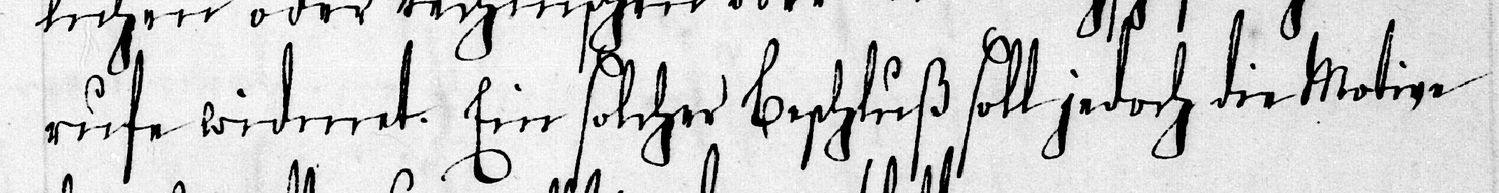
rufe widmet. Ein solcher Beschluß soll jedoch die Motive
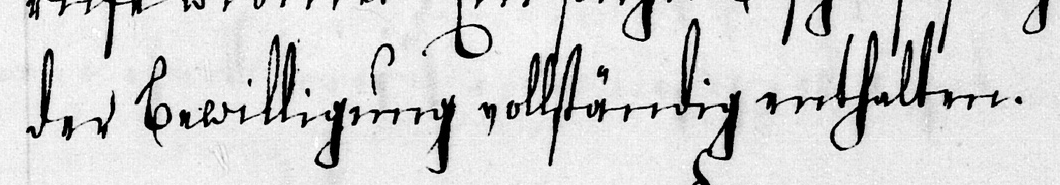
der Bewilligung vollständig enthalten.
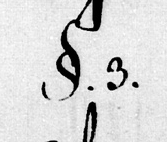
§. 3.
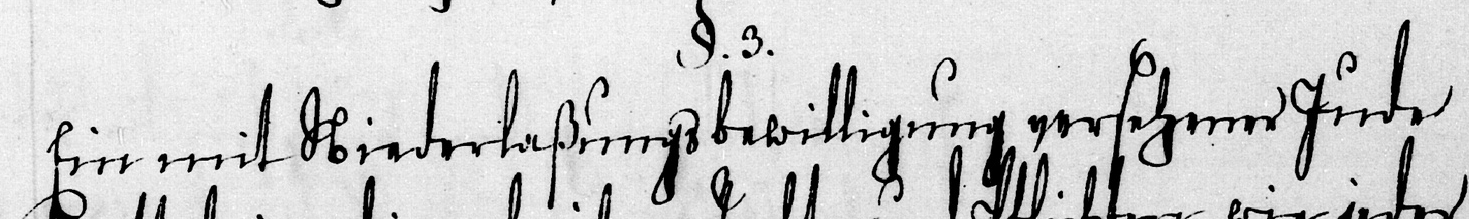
Ein mit Niederlaßungsbewilligung versehener Jude
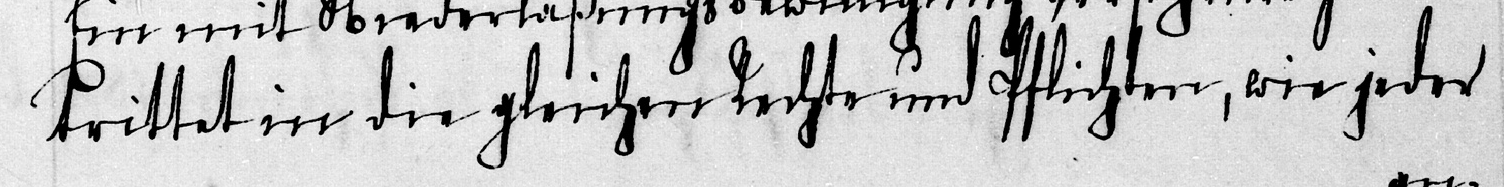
trittet in die gleichen Rechte und Pflichten, wie jeder
